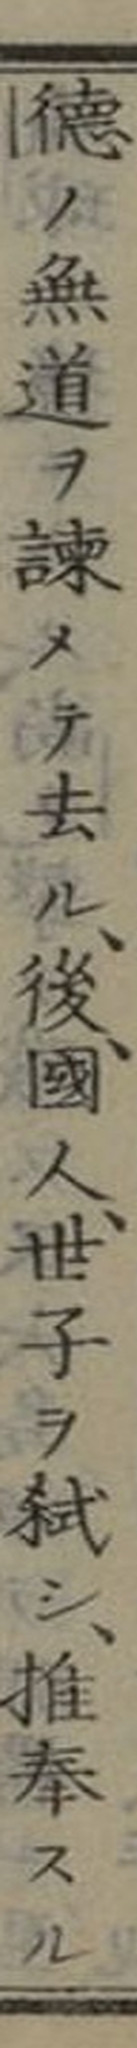徳ノ無道ヲ諫メテ去ル、後、国人、世子ヲ弑シ、推奉スル
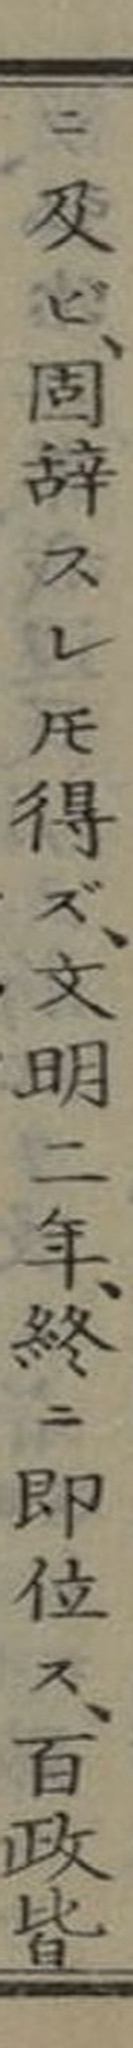ニ及ビ、固辞スレトモ得ズ、文明二年、終ニ即位ス、百政皆
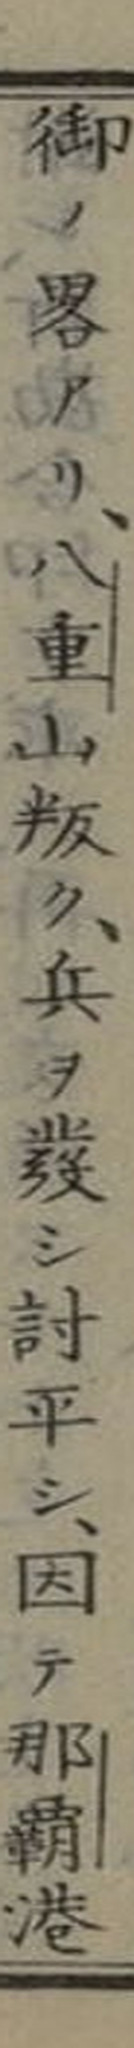御ノ略アリ、八重山叛ク、兵ヲ発シ討平シ、因テ那覇港
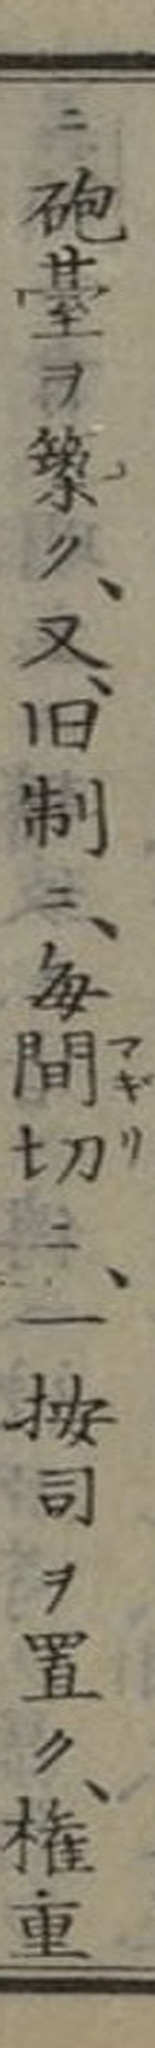ニ砲台ヲ築ク、又、旧制ニ、毎間切ニ、一按司ヲ置ク、権重
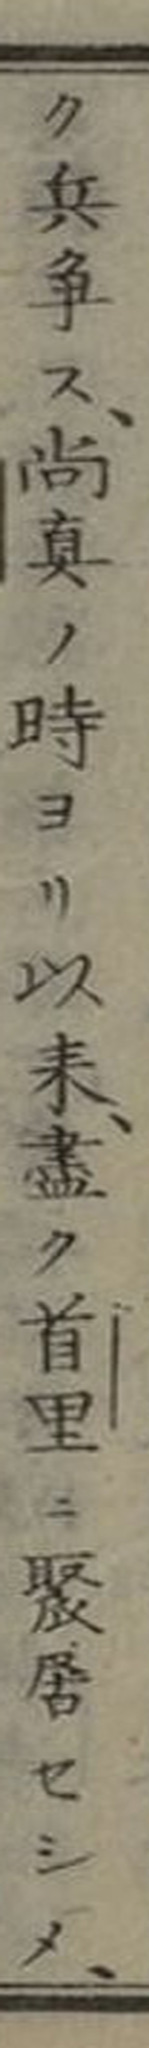ク兵争ス、尚真ノ時ヨリ以来、尽ク首里ニ聚居セシメ、
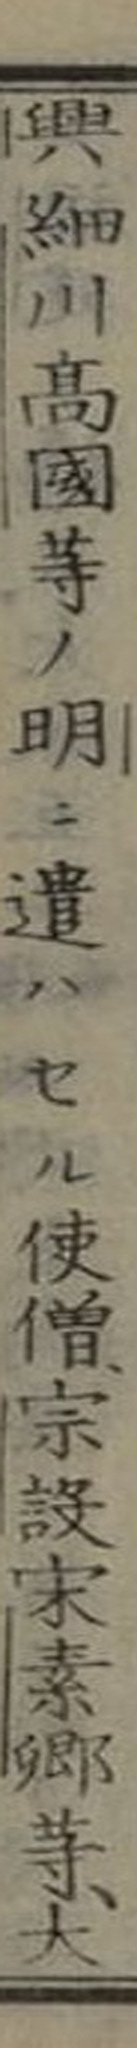興細川高国等ノ明ニ遣ハセル使僧、宗設宋素卿等、大

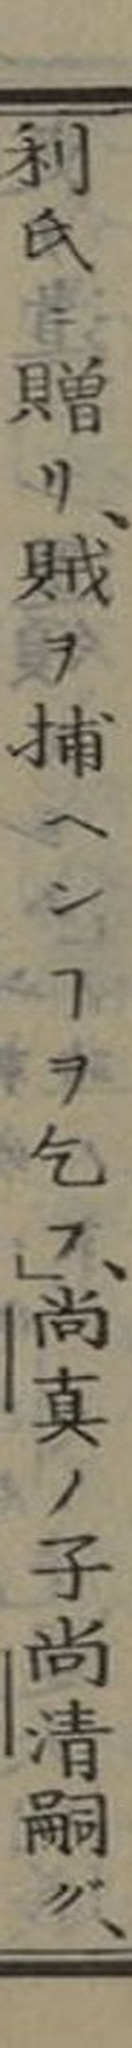利氏ニ贈リ、賊ヲ捕ヘンヿヲ乞フ、」尚真ノ子尚清嗣グ、
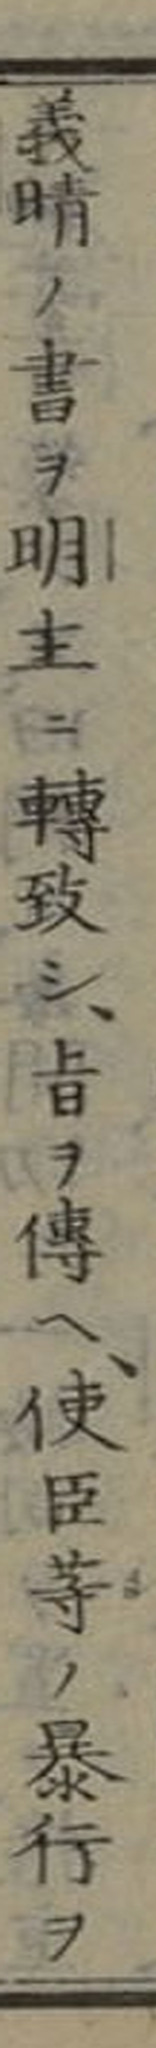義晴ノ書ヲ明主ニ転致シ、旨ヲ伝ヘ、使臣等ノ暴行ヲ
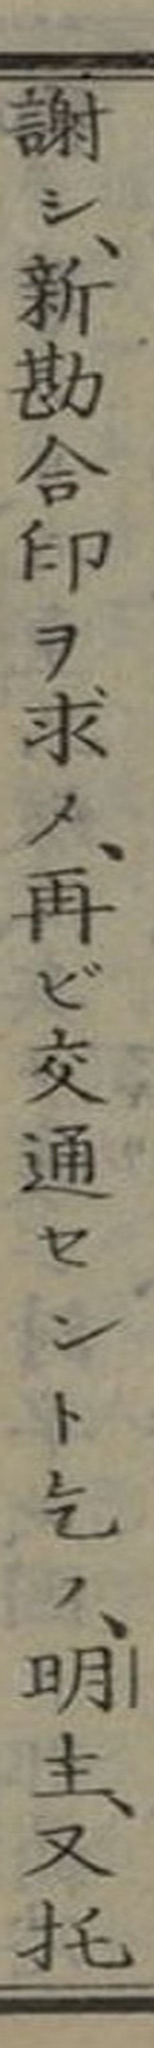謝シ、新勘合印ヲ求メ、再ビ交通セント乞フ、明主、又托
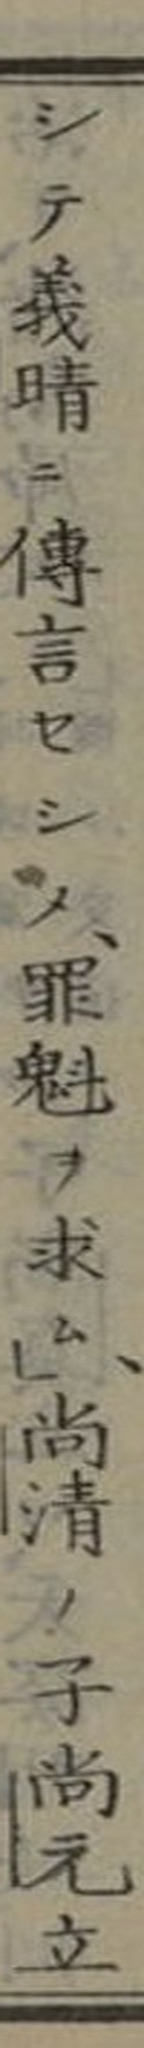シテ義晴ニ伝言セシメ、罪魁ヲ求ム、」尚清ノ子尚元立
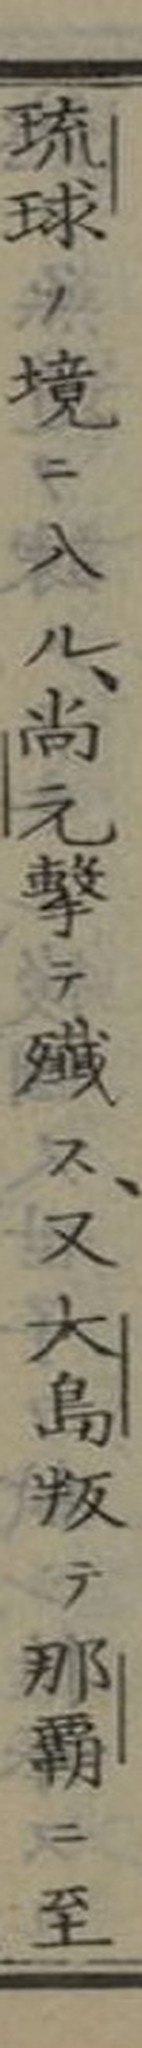琉球ノ境ニ入ル、尚元撃テ殲ス、又大島叛テ那覇ニ至
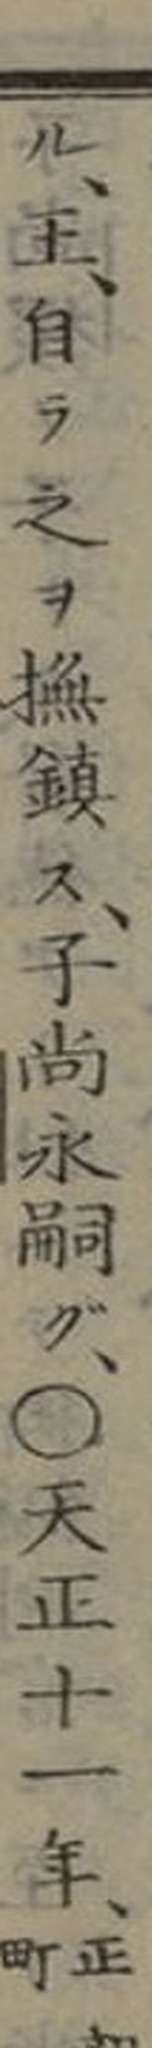ル、王、自ラ之ヲ撫鎮ス、子尚永嗣グ、○天正十一年、正親町
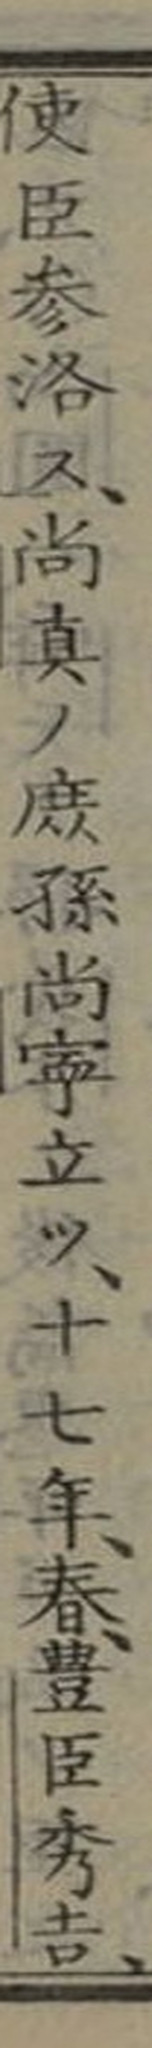使臣参洛ス、」尚真ノ庻孫尚寧立ツ、十七年、春、豊臣秀吉、
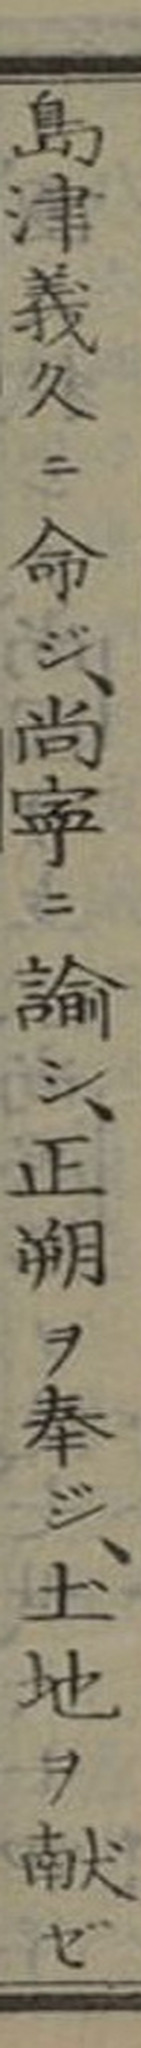島津義久ニ命ジ、尚寧ニ諭シ、正朔ヲ奉ジ、土地ヲ献ゼ
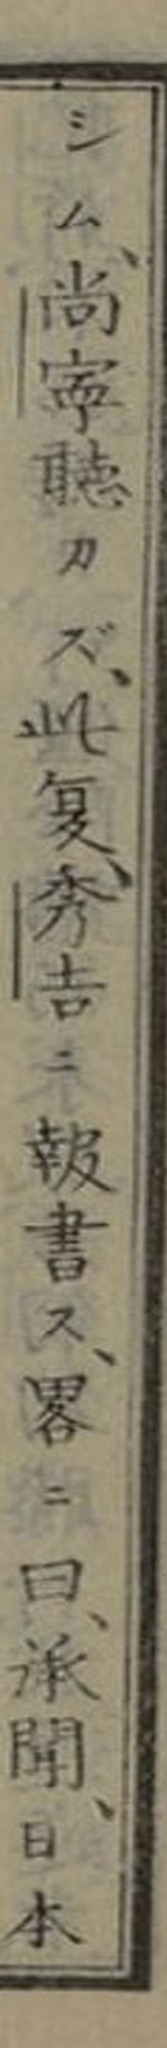シム、尚寧聴カズ、此夏、秀吉ニ報書ス、略ニ曰、承聞、日本
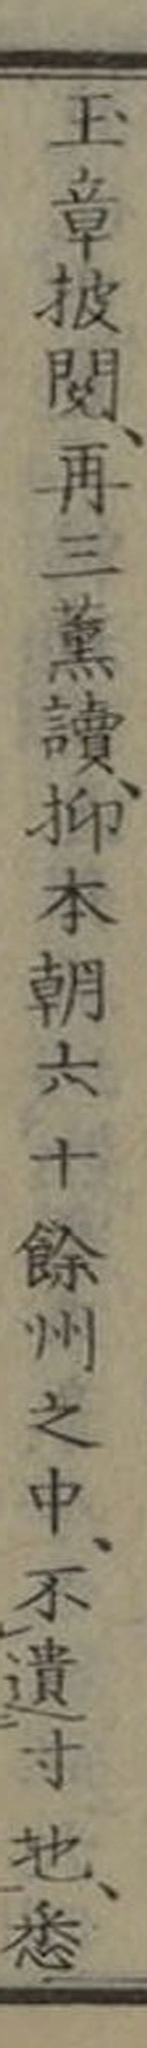玉章披閲、再三薫読、抑本朝六十余州之中、不遺寸地、悉
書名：琉球新誌 図附 上
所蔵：University of the Ryukyus Library
